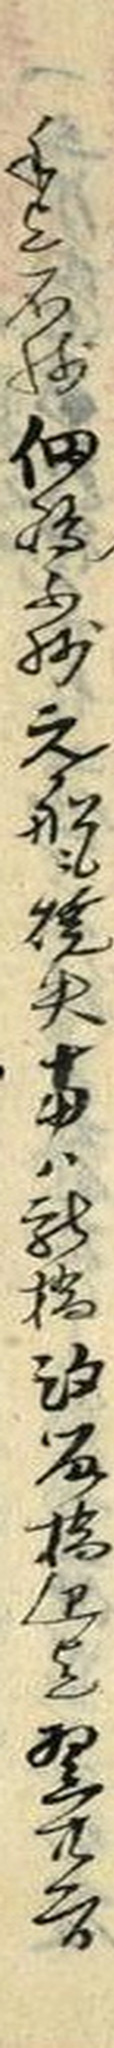手迄不残佃嶋不残元船も焼失南ハ新橋汐留橋辺迄翌廿二日
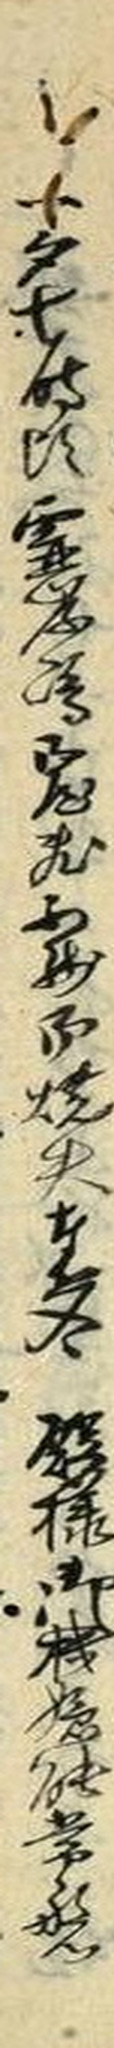一夕七時頃霊岸嶋御屋敷不残御焼失本夕殿様御機嫌能常盤
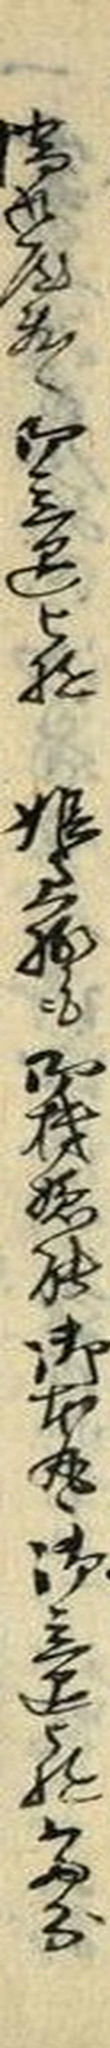橋御屋敷へ御立退被遊姫君様も御機嫌能御本丸へ御立退被遊当分
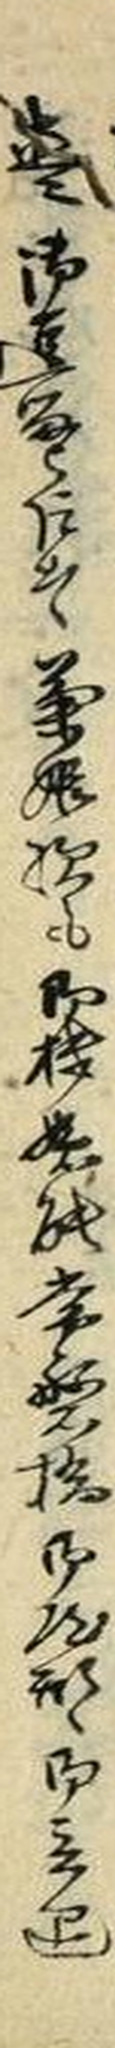直々御逗留被仰出候菊姫様も御機嫌能常盤橋御屋形へ御立退

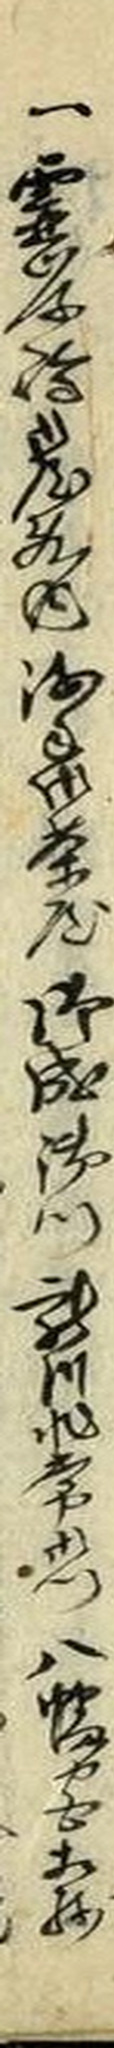一霊岸嶋御屋敷内海手御茶屋御成御門新川非常御門八幡宮相残
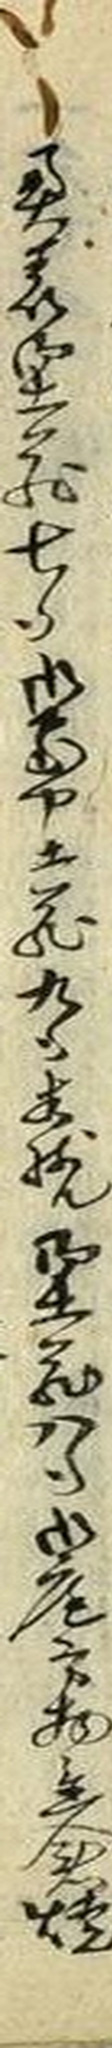奥表御土蔵七ツ御家中土蔵九ツ相残ル御土蔵八ツ御庭方物置倉焼
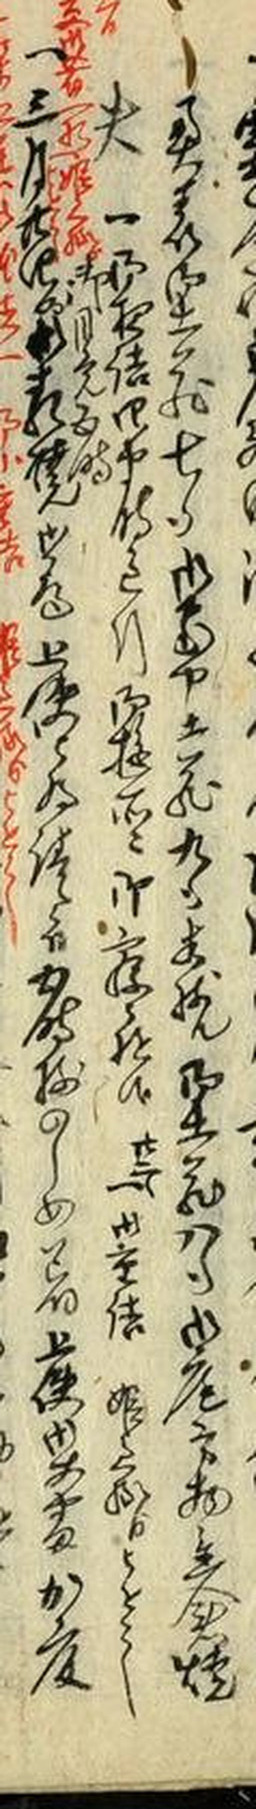失一御夜詰四半時過引御接所ニ御寝被遊候廿二日一御重詰姫君様ゟ被進之
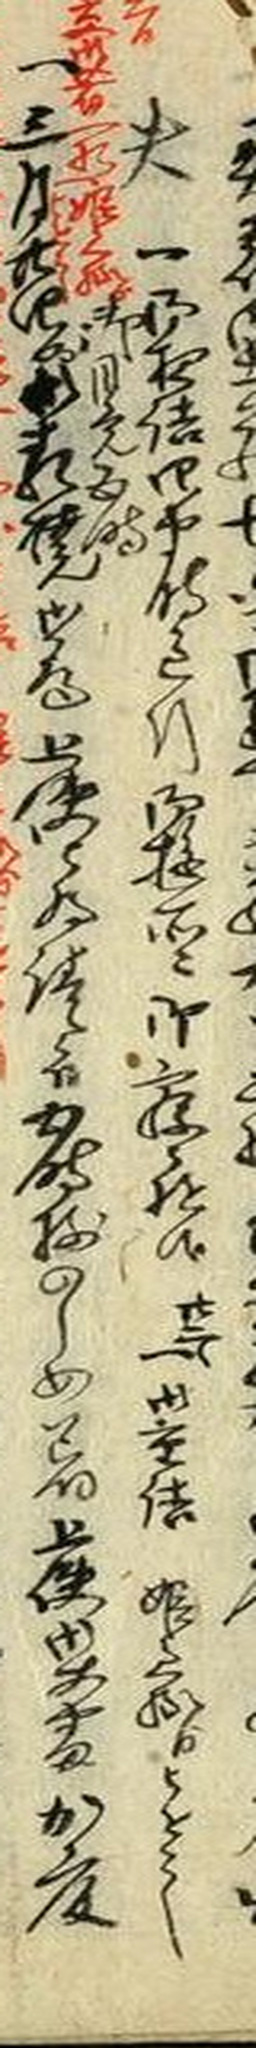一三月廿四日御目覚五時御類焼御丸上使被為請候二付五時揃のしめ着上使御使番加藤
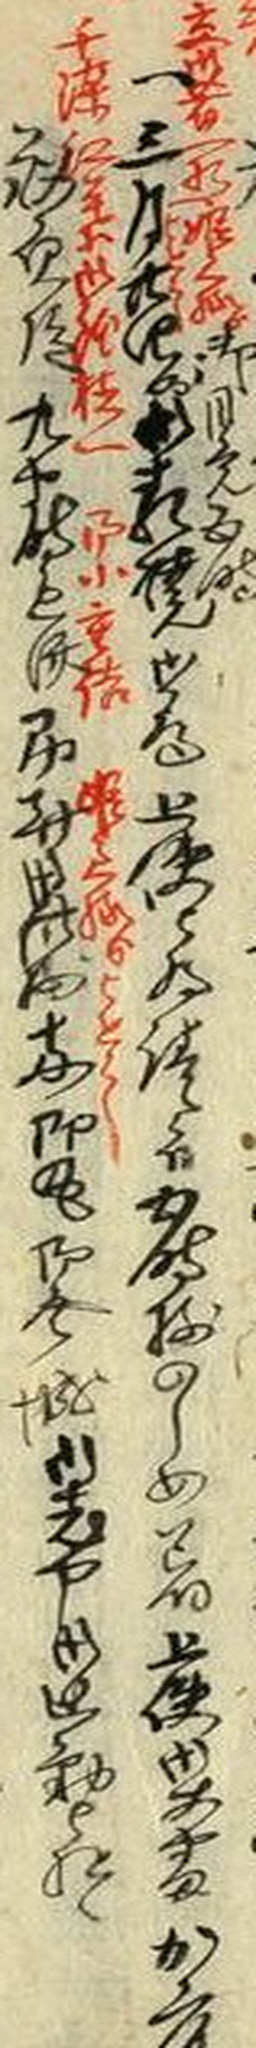靭負殿九半時過済即刻御供揃両御丸御登城御老中御廻り勤被遊候
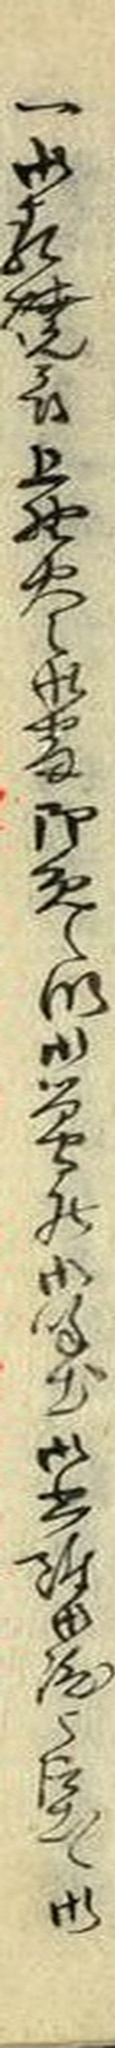一御類焼ニ付上野火之御番御免之段御留守居御呼出御書付御渡被仰出候御
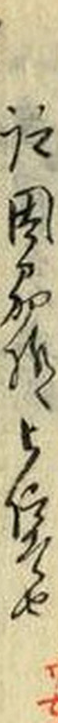跡因州様へ被仰出候由
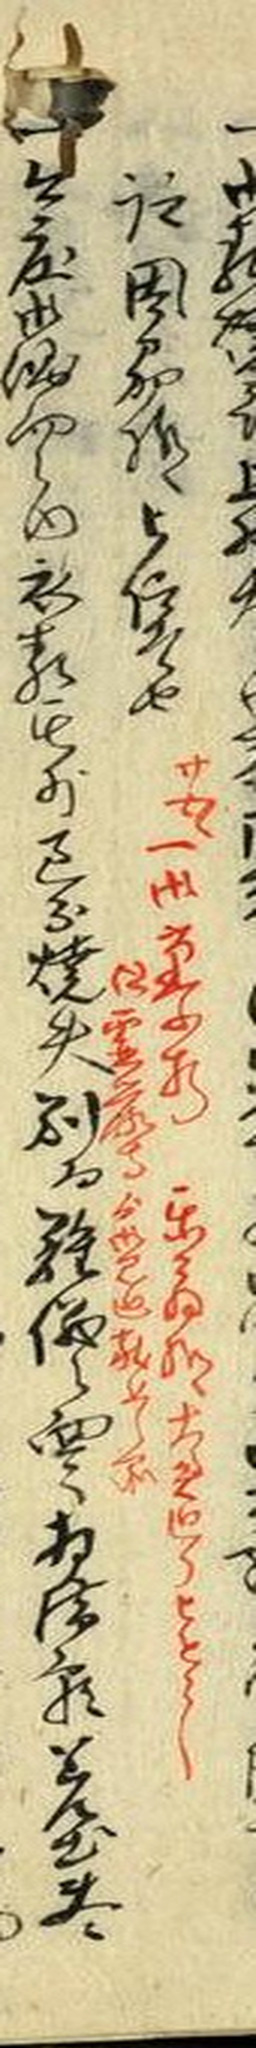一今度御側向之内衣類其外過分焼失別而難儀之面々拝借願差出夫々
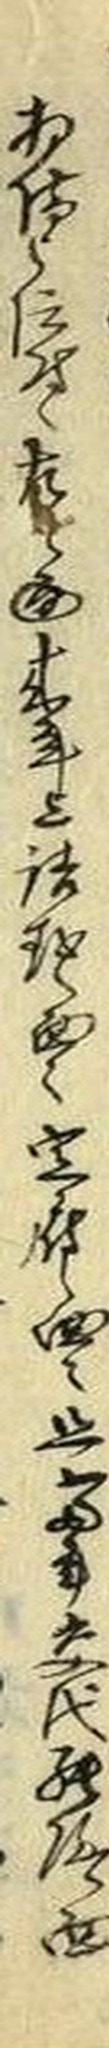拝借被仰付候右之通来年迄詰越候面々定府之面々且当年交代罷越候面
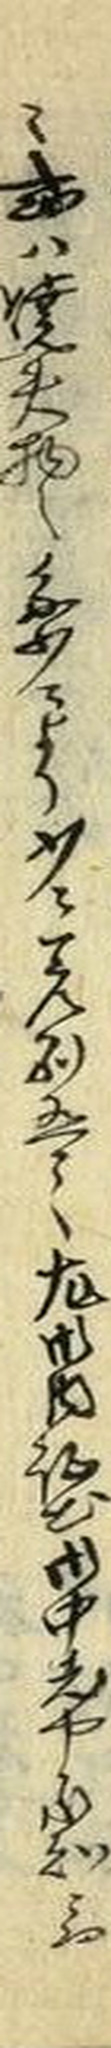々或ハ焼失物之多少ニより少々差別有之尤御内証出御中老中承知ニ而
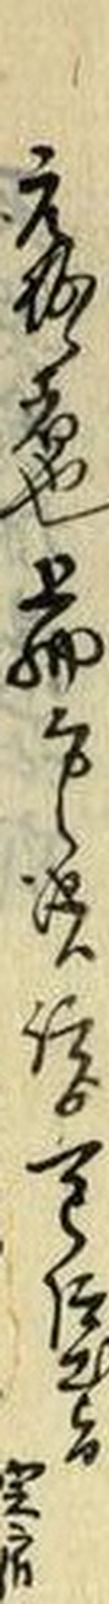取扱候者也上納方之儀ハ跡ゟ可被仰出旨
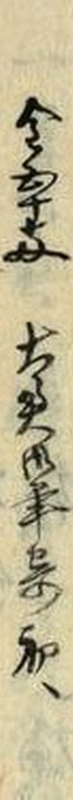金五十両大奥御年寄初へ
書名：少傅日録抄（斉承付側向頭取日記、在府）
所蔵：福井県文書館 Fukui Prefectural Archives
